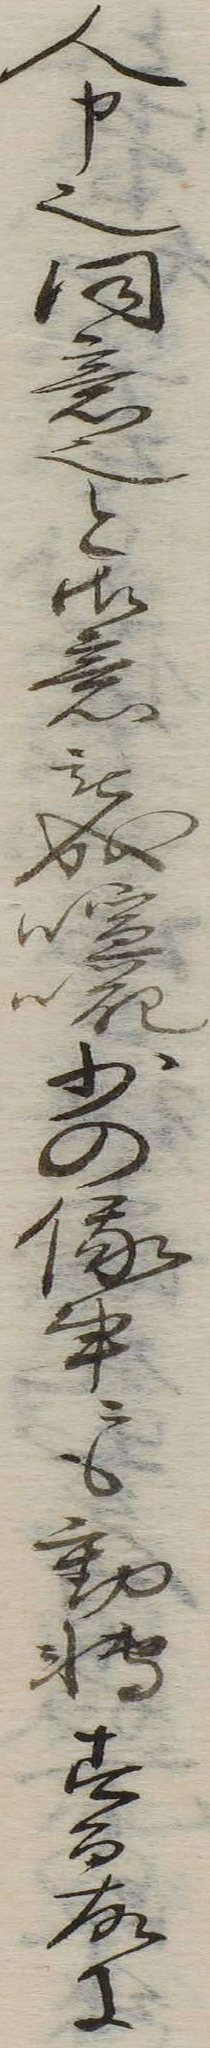人申也同意也と御意被成喧嘩少の俄事ニも動転する故に
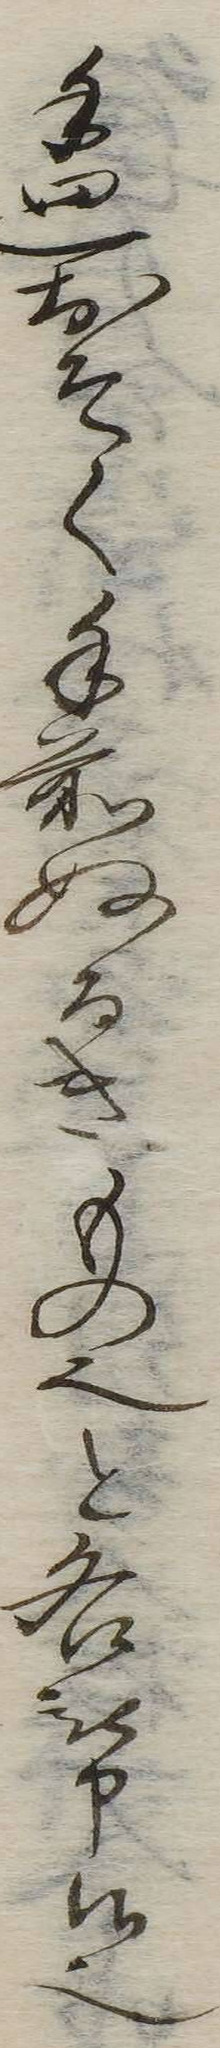手廻おそく手前ぬるきもの也と各被申候也
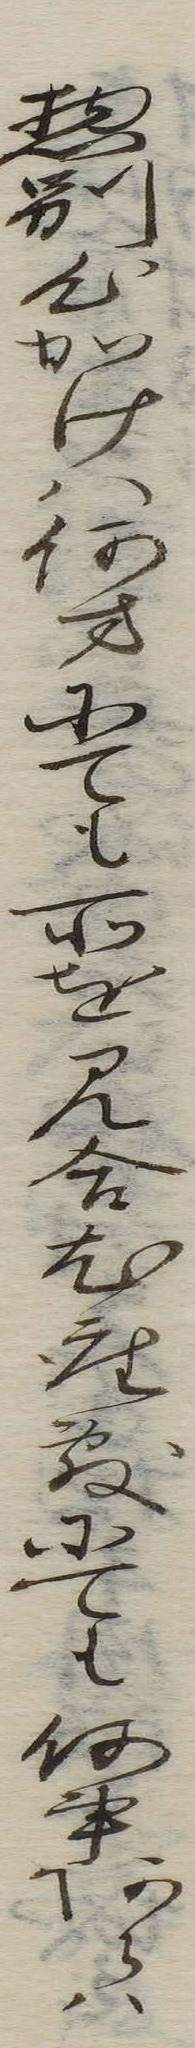一惣別心かけは何方にても所を見合尤座敷にても何事あらは
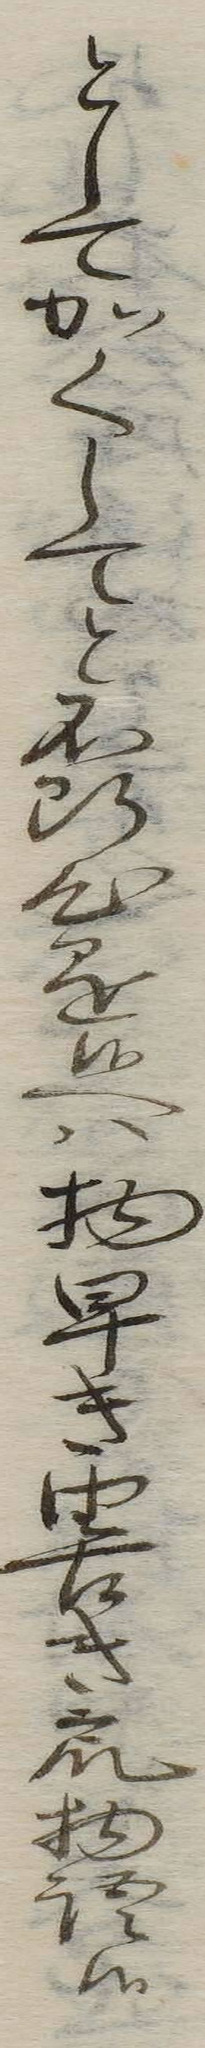としてかくしてと不断心懸候へは物早き由古き衆物語候
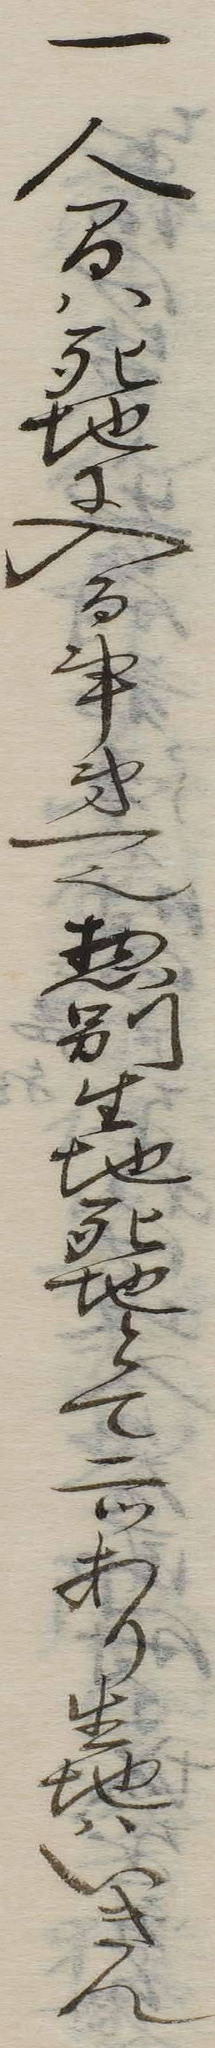一人間は死地に入る事第一也惣別生地死地とて二ツあり生地はいきん
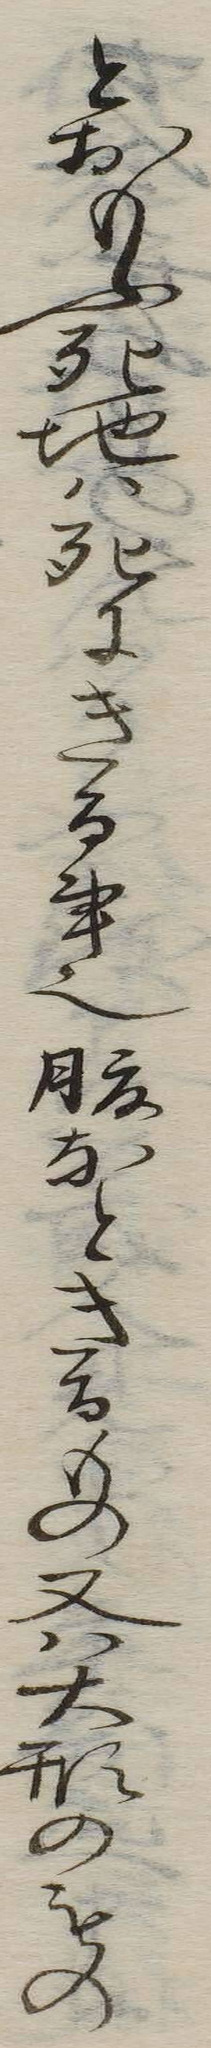とおもふ死地は死にきる事也腹なときるもの又は大形のもの
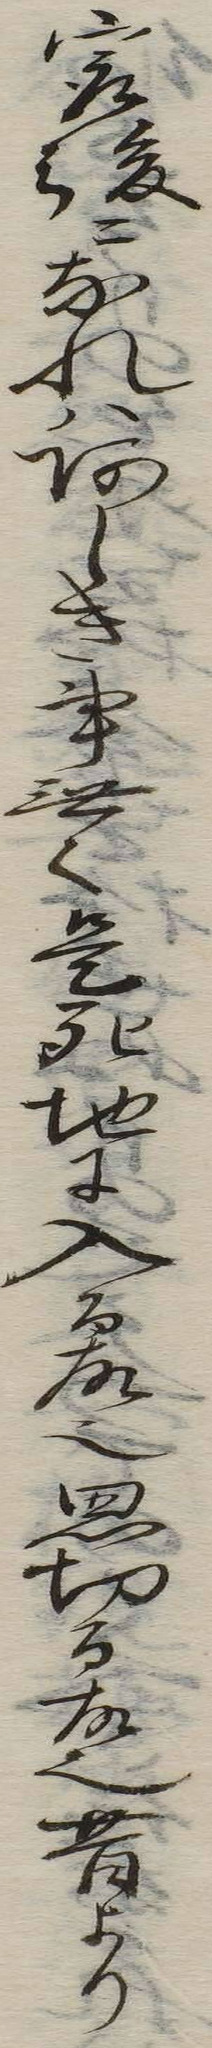最後ニなれはあしき事無く是死地に入る故也思切る故也昔より
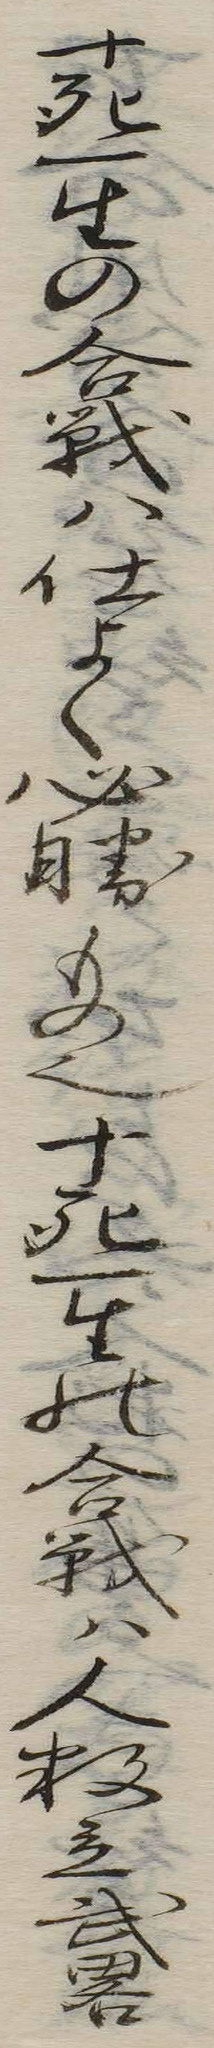十死一生の合戦は仕よく必勝もの也十死一生の合戦は人数立武略
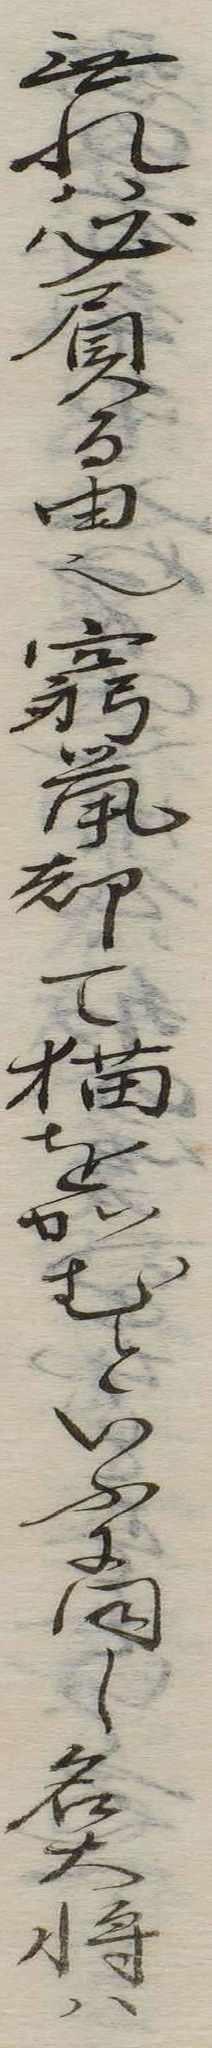無れは必負る由也窮鼠却て猫をかむといふに同し名大将は
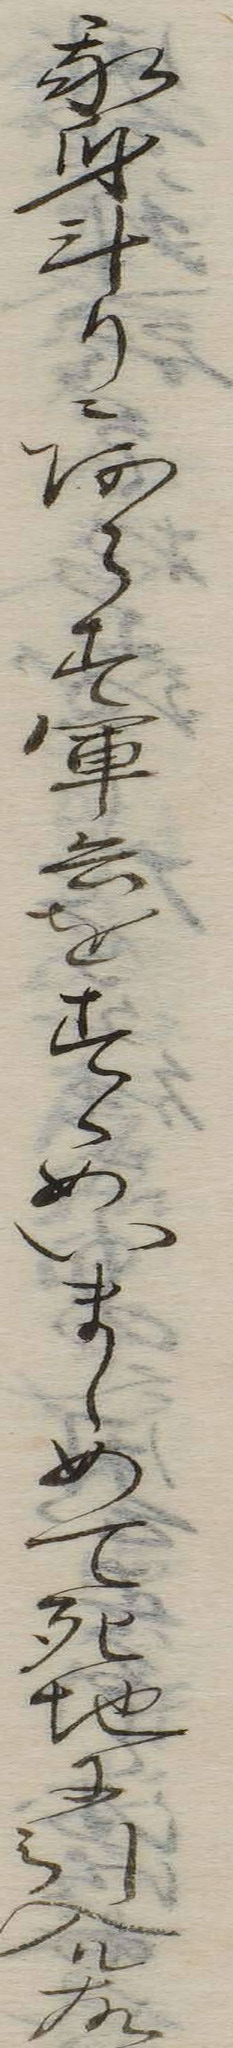我身斗りニあらす軍兵をすゝめいましめて死地に引入ル故
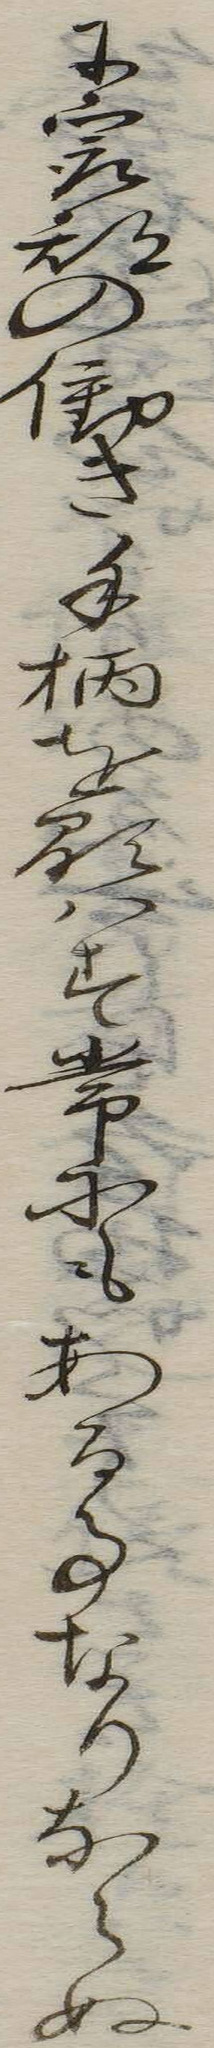に最期の働き手柄を顕はす常にもある事なりならぬ
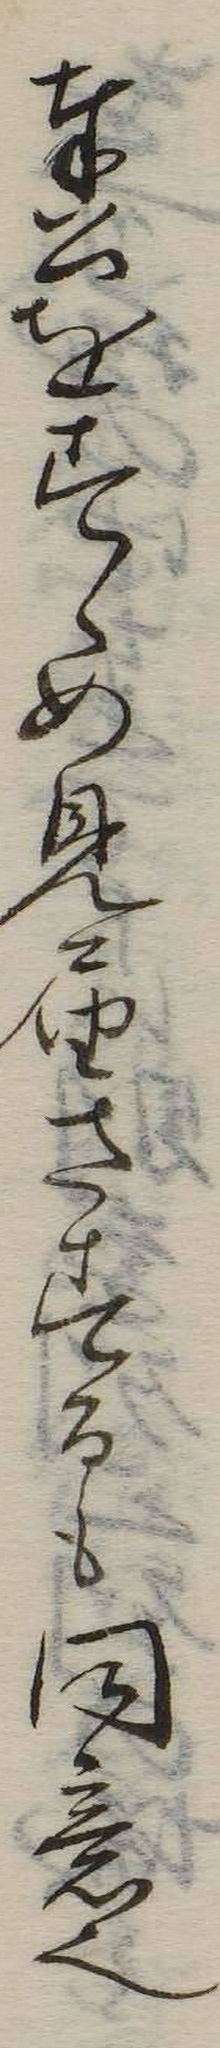奉公をすゝめ見届さするも同意也
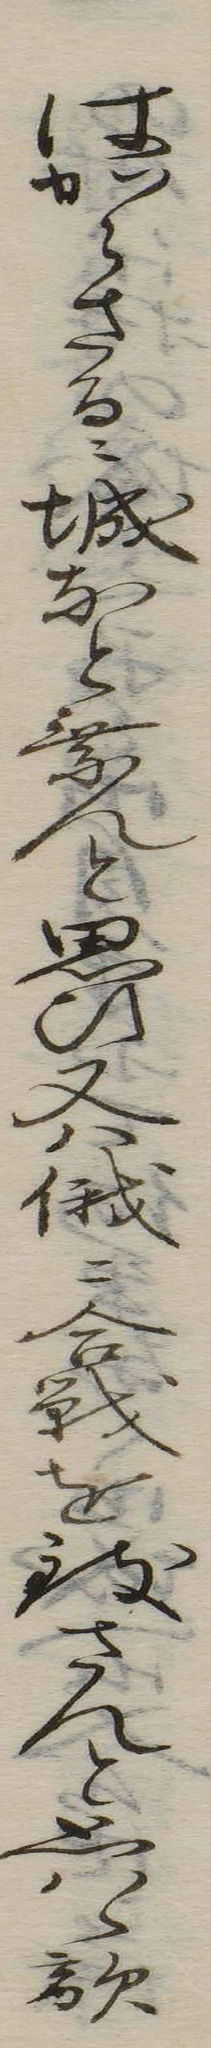一はからさるニ城なと乗んと思ひ又は俄ニ合戦を致さんと思はゝ敵
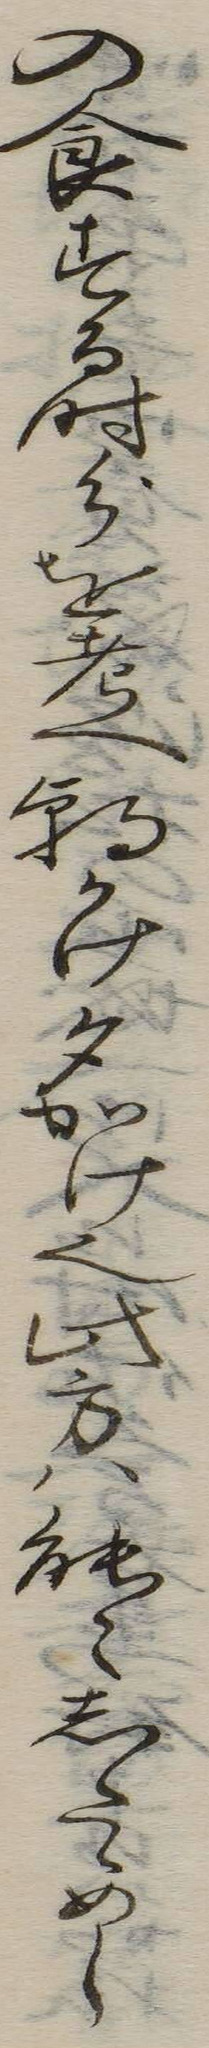の食する時分を考えへ朝かけ夕かけ也此方は能々したゝめし
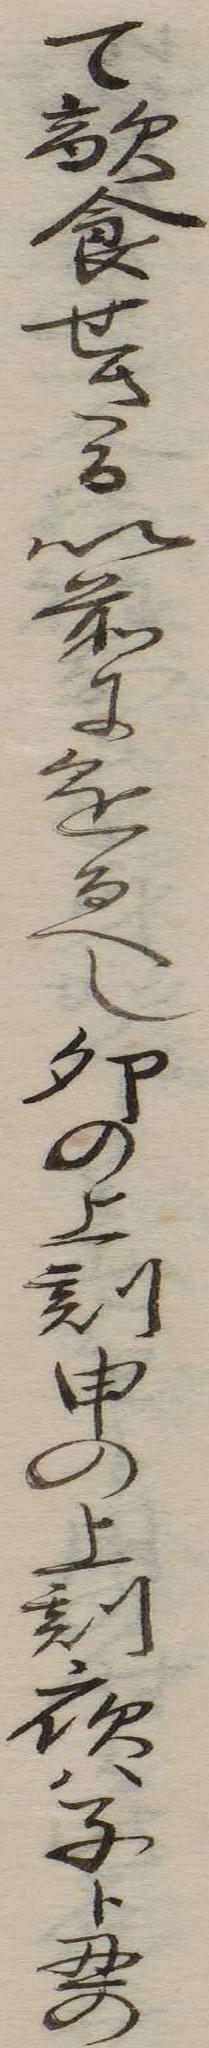て敵食せさる以前に懸るへし卯の上刻申の上刻夜は子ト丑の
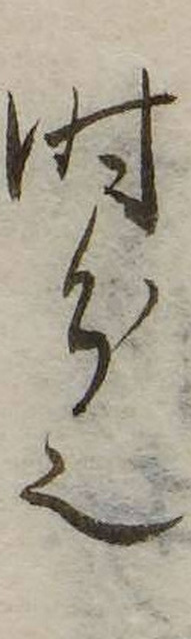時分也
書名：三河之物語
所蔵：国文学研究資料館
